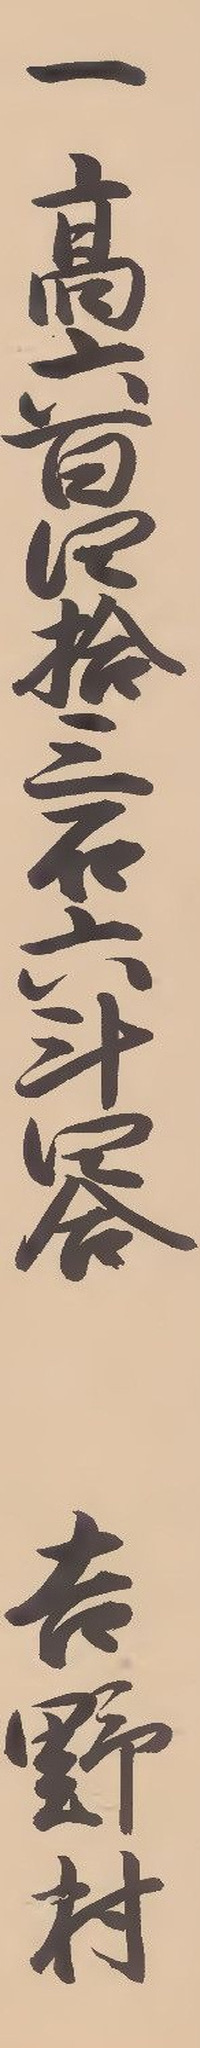一高六百四拾三石六斗四合吉野村
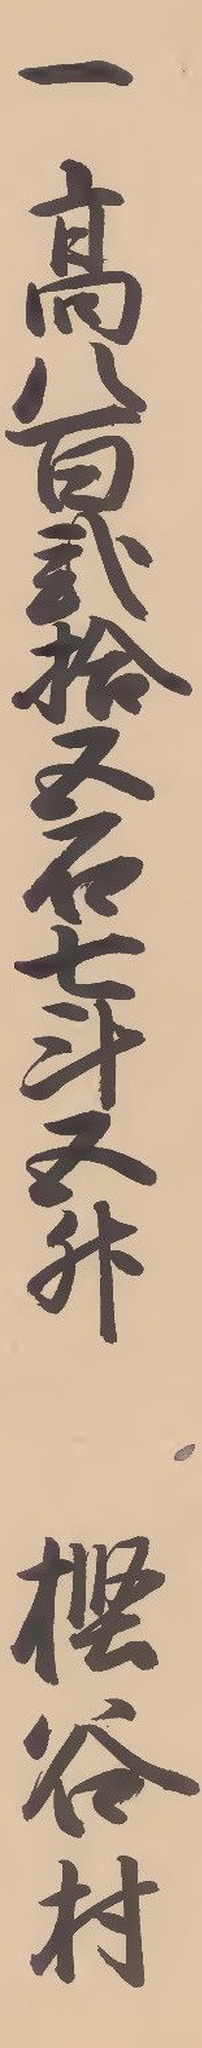一高八百弐拾五石七斗五升樫谷村

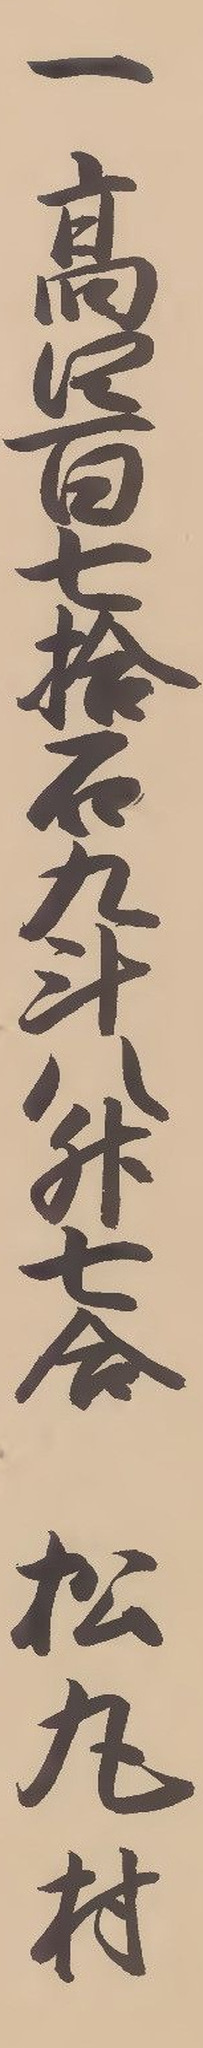一高四百七拾石九斗八升七合松丸村
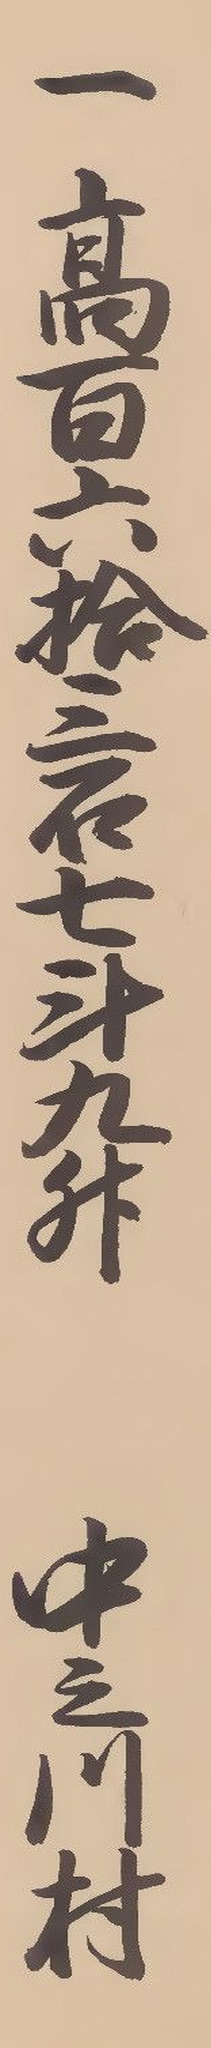一高百六拾三石七斗九升中之川村
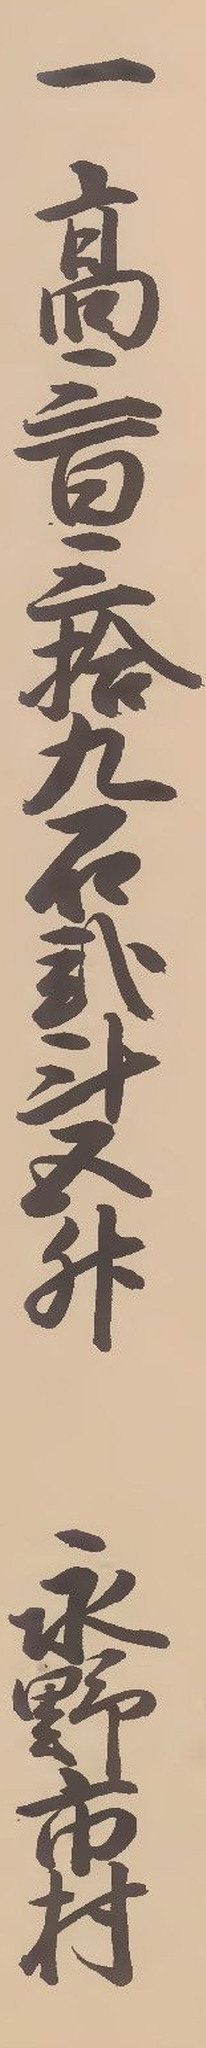一高三百三拾九石弐斗五升永野市村
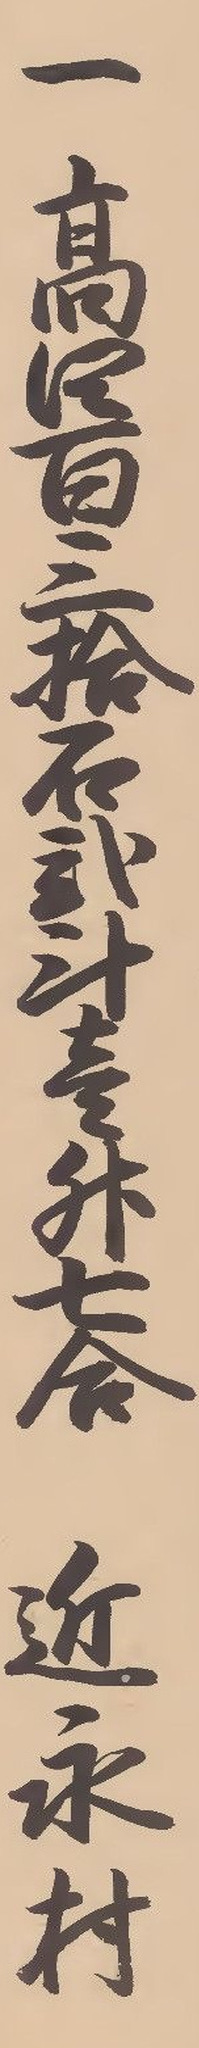一高四百三拾石弐斗壱升七合近永村
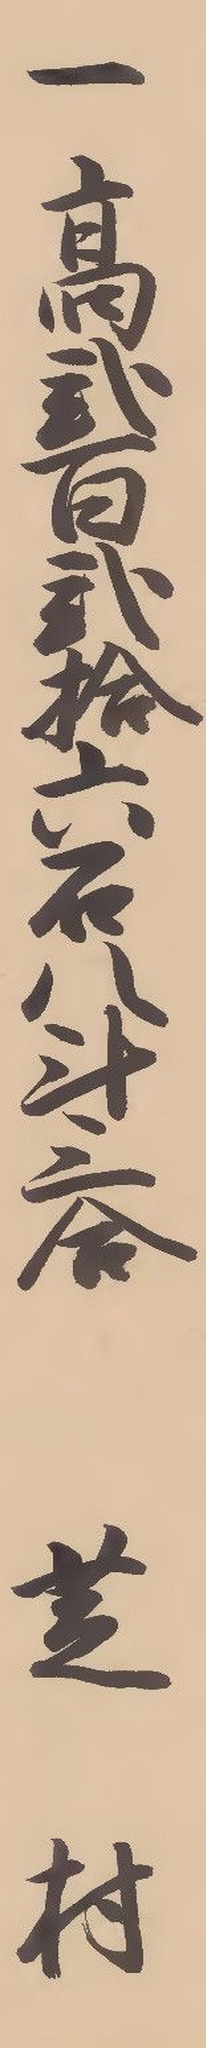一高弐百弐拾六石八斗三合芝村
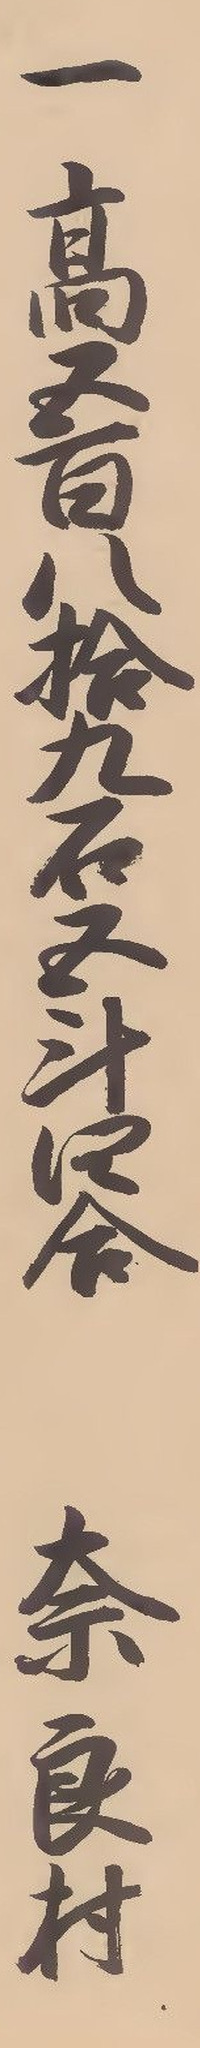一高五百八拾九石五斗四合奈良村
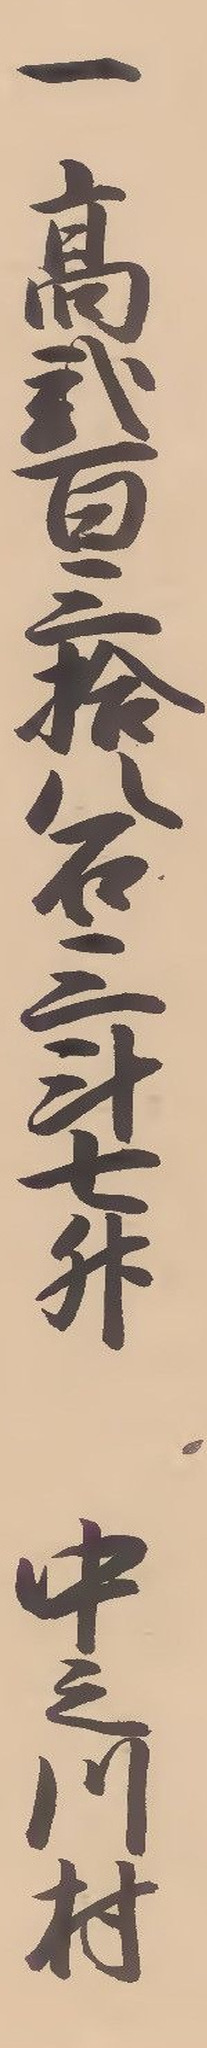一高弐百三拾八石三斗七升中之川村

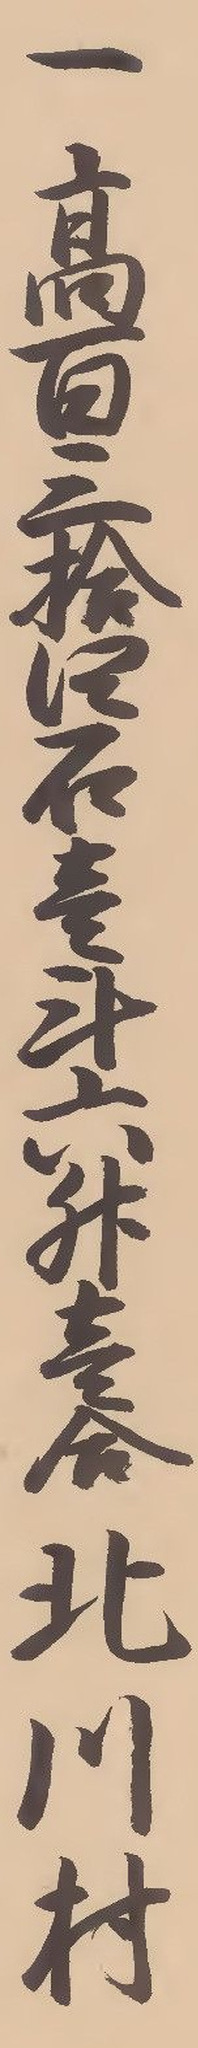一高百三拾四石壱斗六升壱合北川村
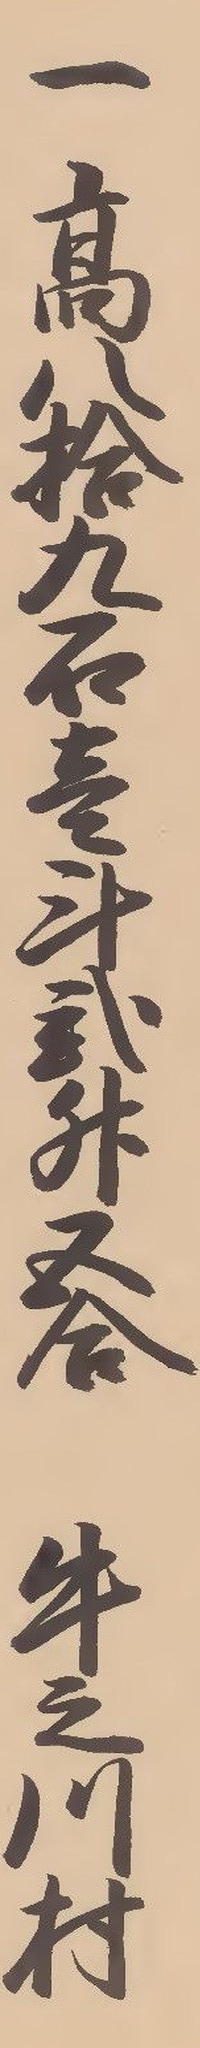一高八拾九石壱斗弐升五合牛之川村
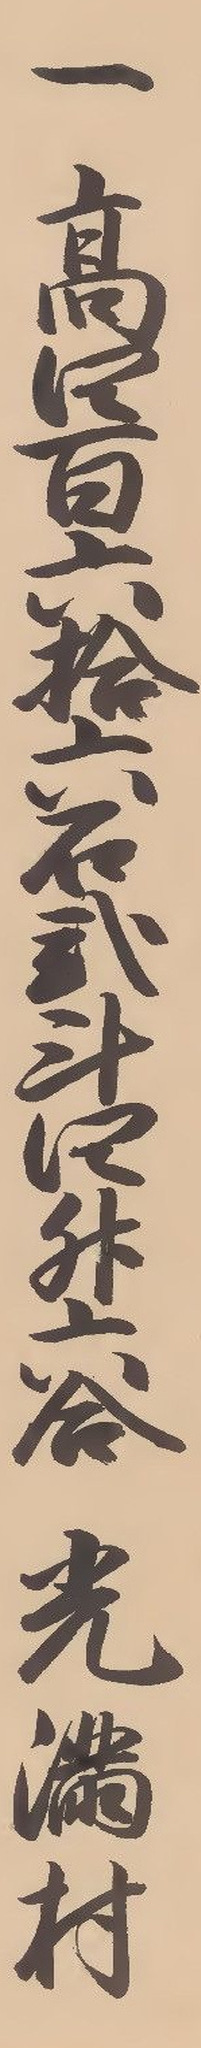一高四百六拾六石弐斗四升六合光満村
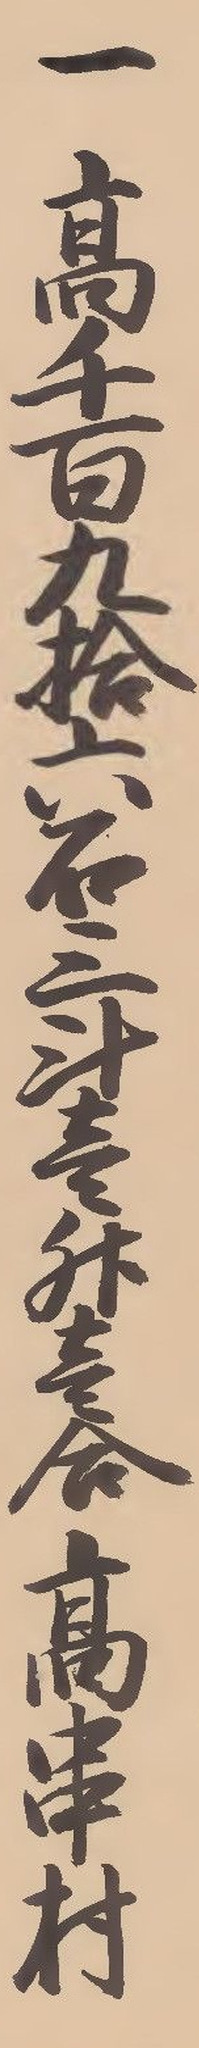一高千百九拾六石三斗壱升壱合高串村
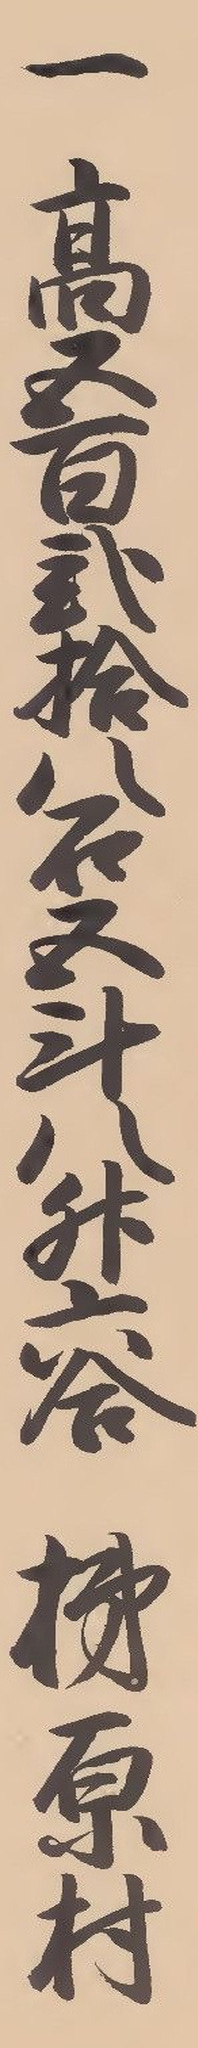一高五百弐拾八石五斗八升六合柿原村
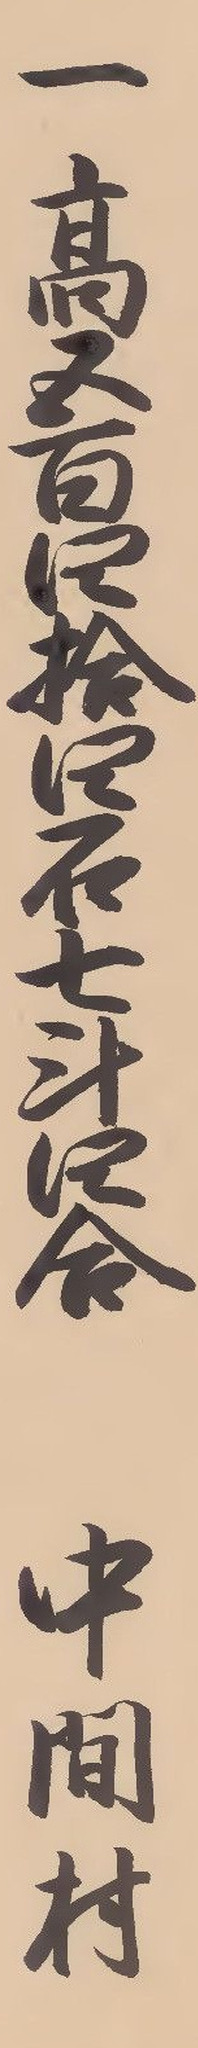一高五百四拾四石七斗四合中間村
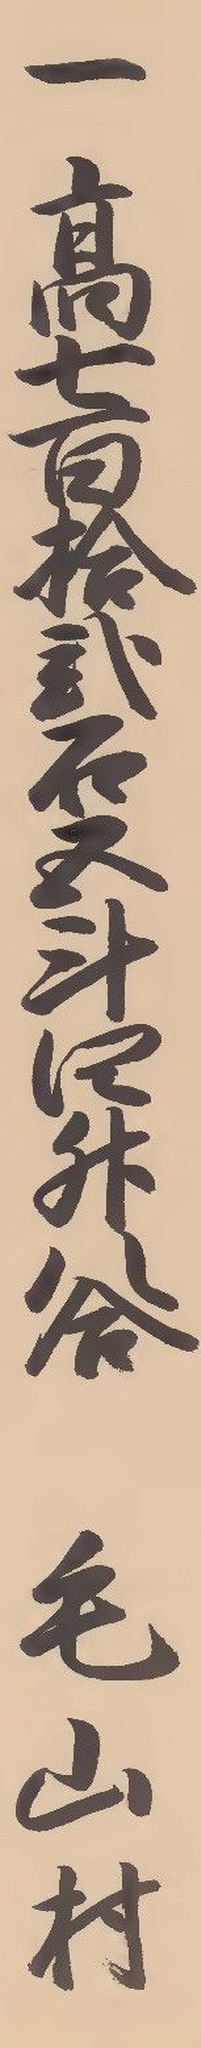一高七百拾弐石五斗四升八合毛山村
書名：伊予国郷帳
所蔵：国立公文書館 National Archives of Japan
